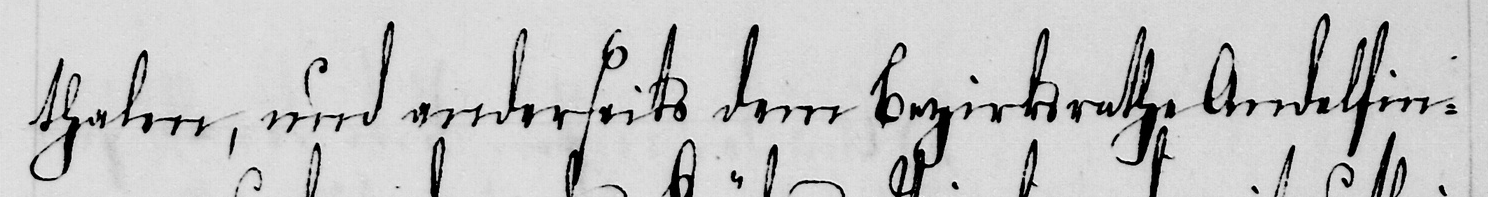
thalen, und anderseits dem Bezirksrathe Andelfin¬
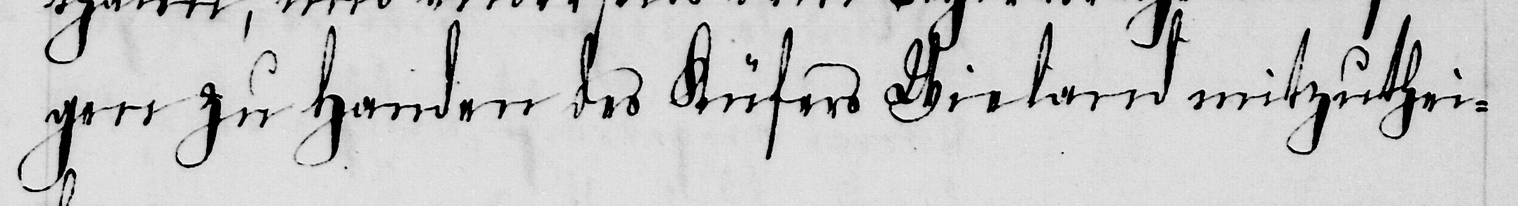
gen zu Handen des Küfers Wieland mitzuthei¬
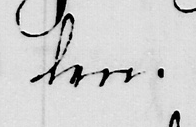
len.
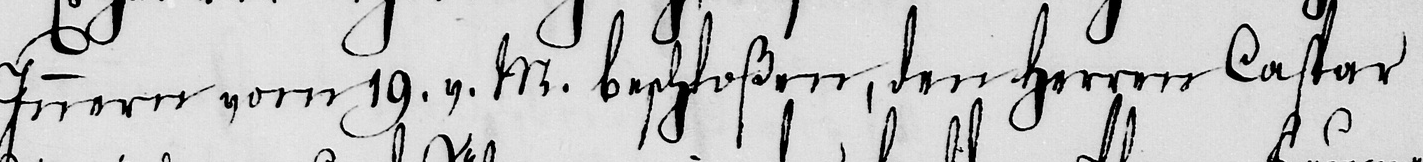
Innern vom 19. v. M. beschloßen, den Herren Caspar
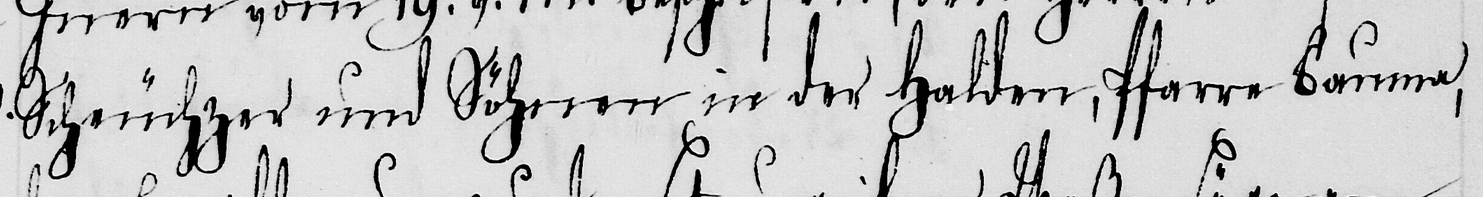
Scheuchzer und Söhnen in der Halden, Pfarre Bauma,
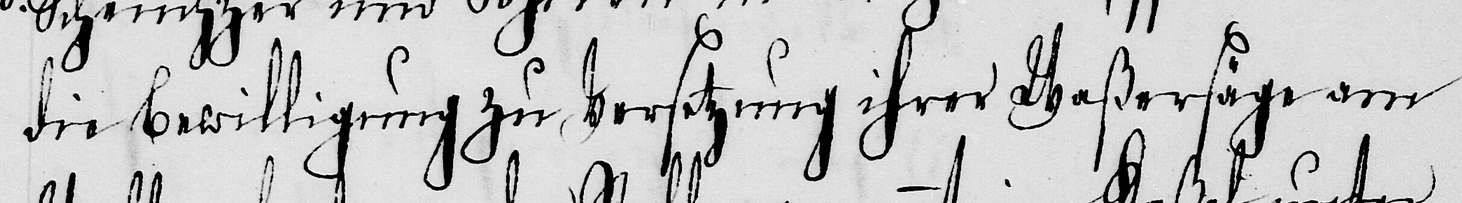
die Bewilligung zu Versetzung ihrer Waßersäge am
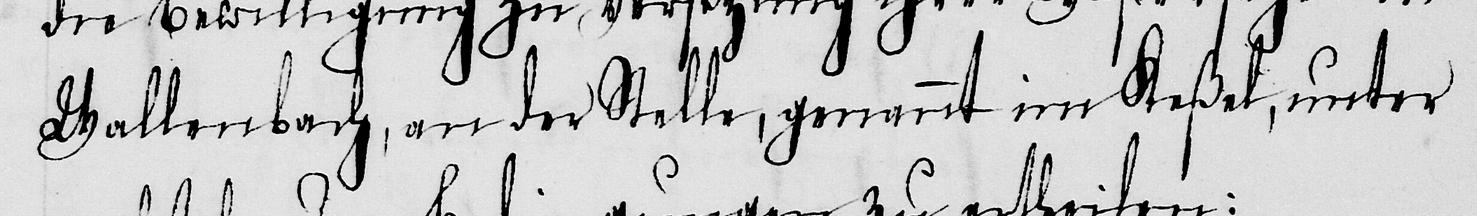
Wallenbach, an der Stelle, genannt im Keßel, unter
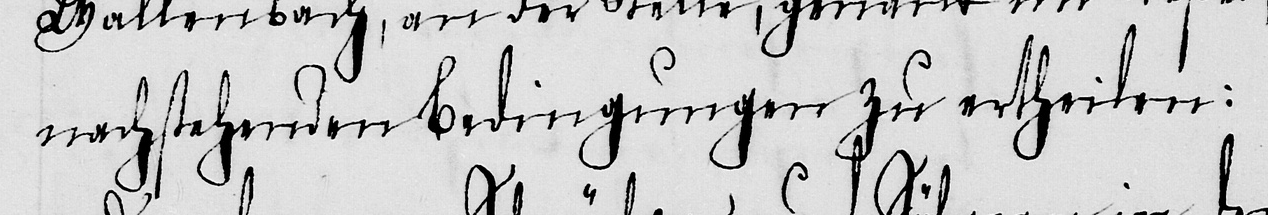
nachstehenden Bedingungen zu ertheilen:
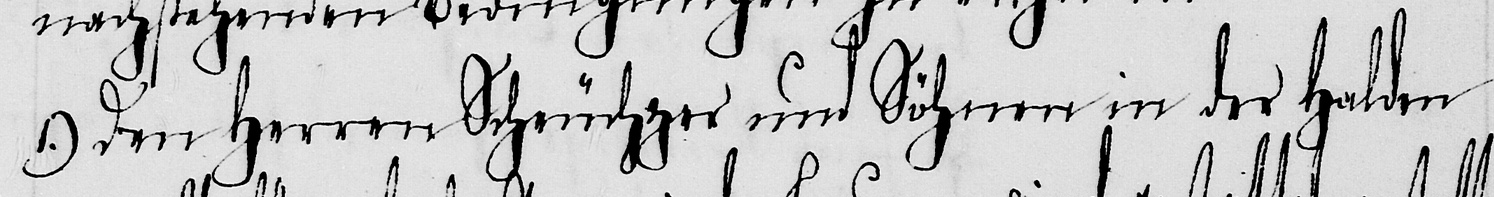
1.) Den Herren Scheuchzer und Söhnen in der Halden
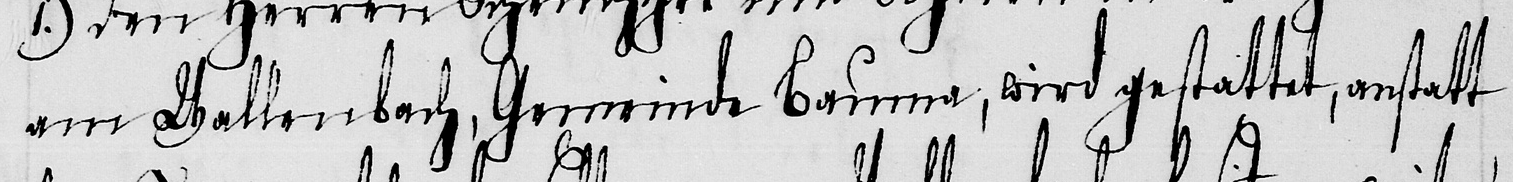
am Wallenbach, Gemeinde Bauma, wird gestattet, anstat¬
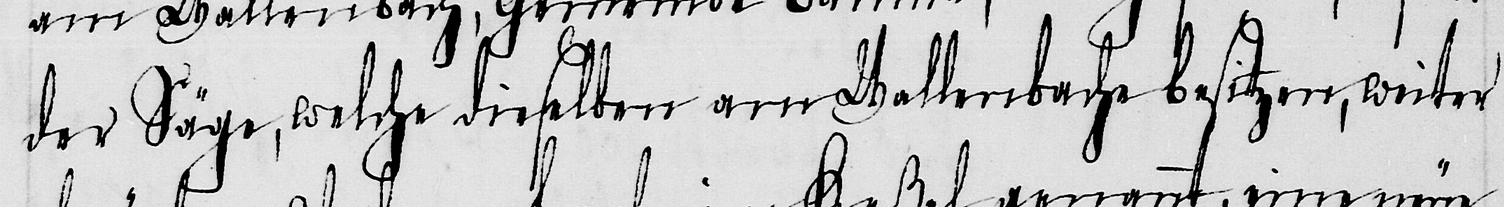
der Säge, welche dieselben am Wallenbache besitzen, weiter
